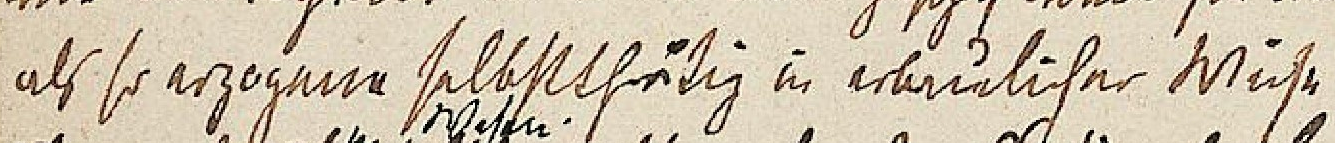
als so erzogen selbstthätig in erbaulicerh Weise
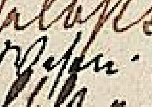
Wesen
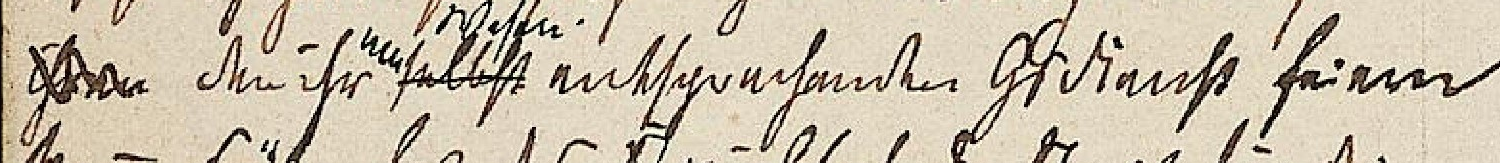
ihren, dem ihr selbst entsprechenden Gsdienst feiern
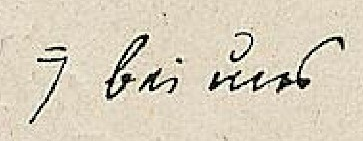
] bei uns
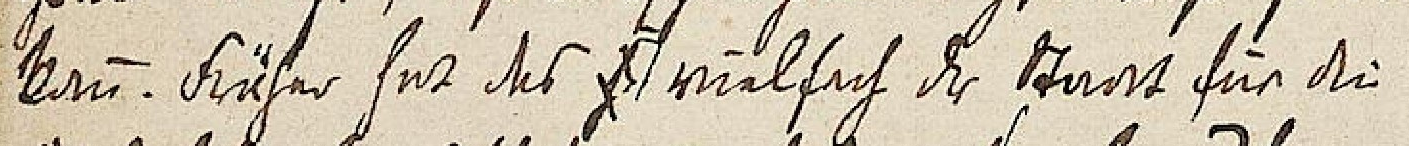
kan. Früher hat das ihr vielfach der Staat für die
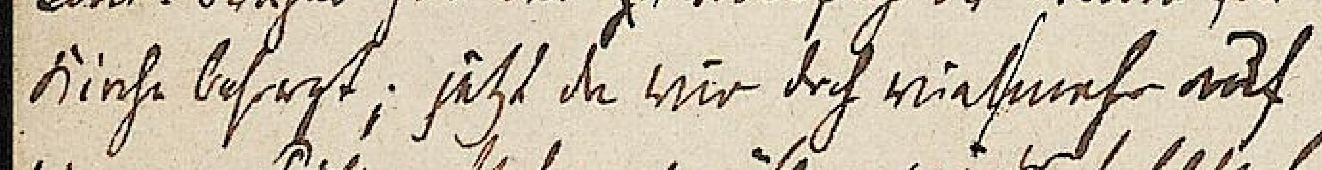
Kirche besorgt, jetzt da wir doch vielmehr auf
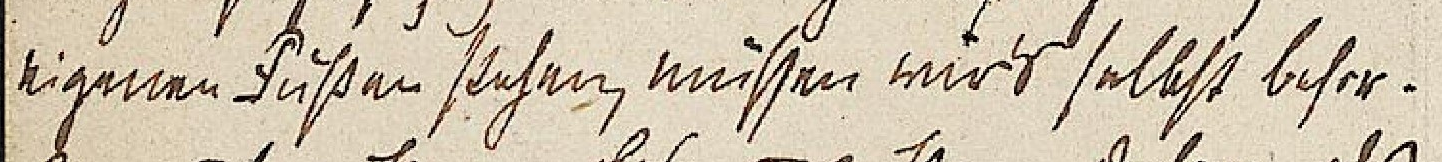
eigenen Füßen stehen, müssen wir's selbst besor¬
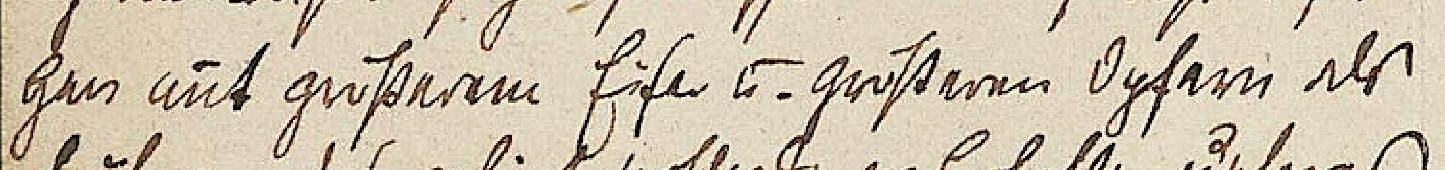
gen mit größerem Eifer u. größeren Opfern als
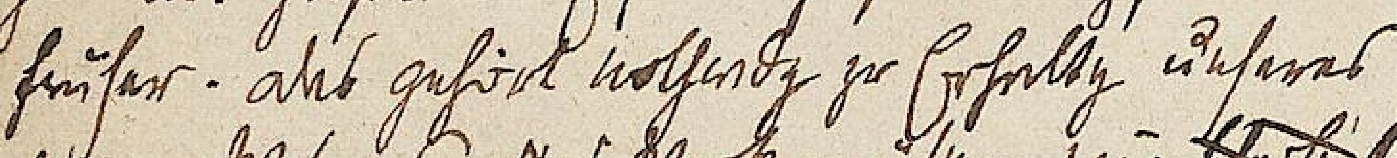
früher: Das gehört nothwdg zur Erhaltg unseres
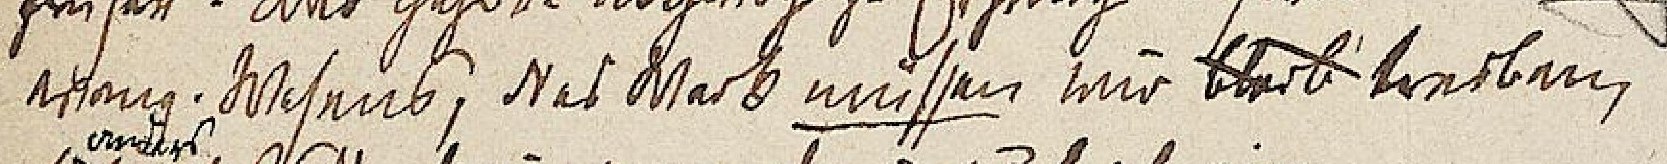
evang. Wesens, das Werk müssen wir bleib treiben,
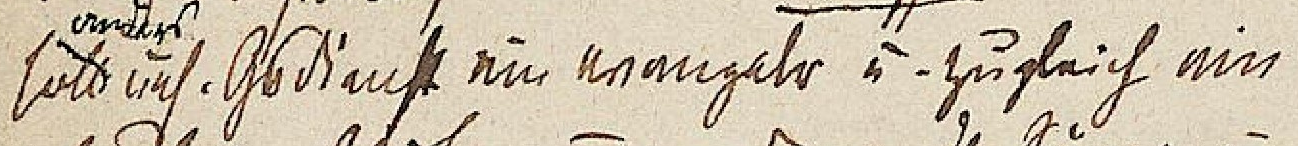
soll uns. Gsdienst ein evangelr. u. zugleich ein
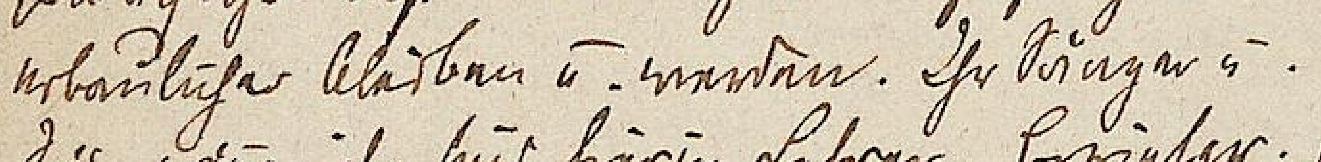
erbaulicher bleiben u. werden. Ihr Sänger u.
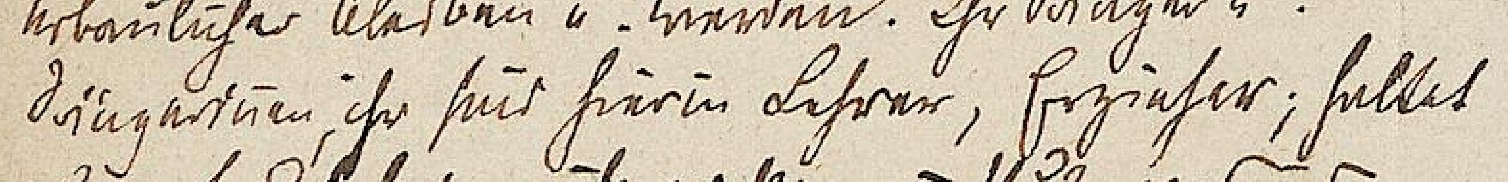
Sängerinen, ihr seid hierin Lehrer, Erzieher; haltet
